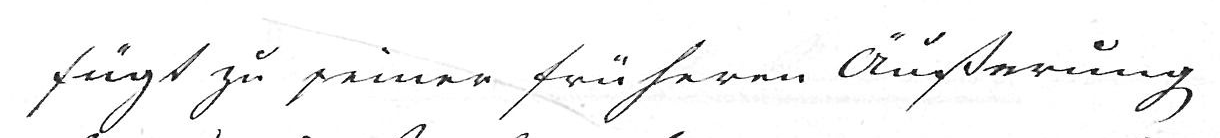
fügt zu seiner früheren Äußerung
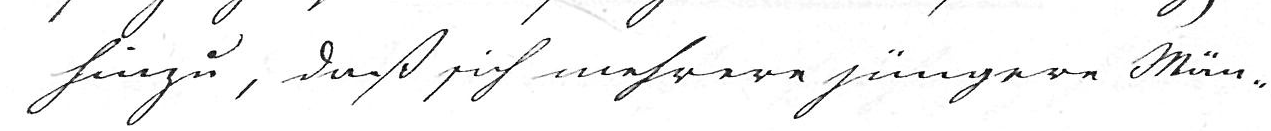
hinzu, daß sich mehrere jüngere Män-
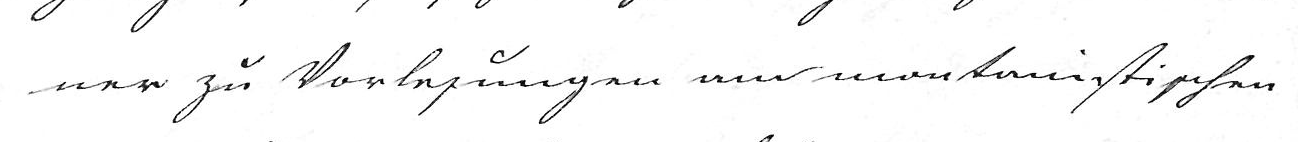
ner zu Vorlesungen am montanistischen
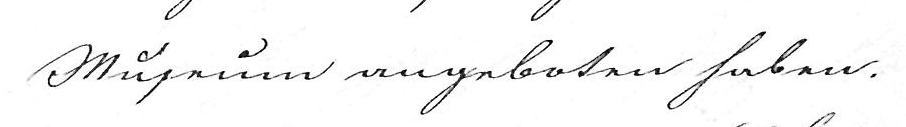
Museum angeboten haben.
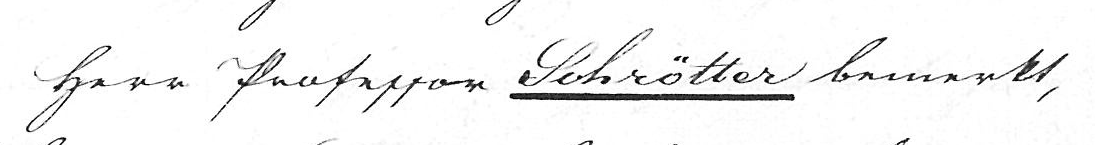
Herr Professor Schrötter bemerkt,
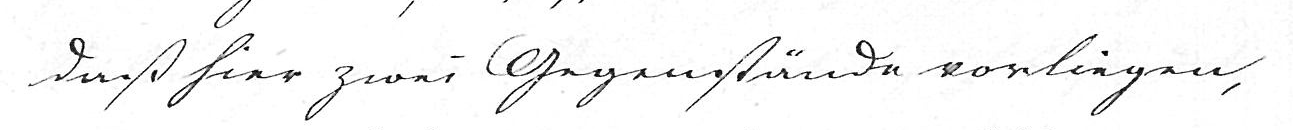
daß hier zwei Gegenstände vorliegen,
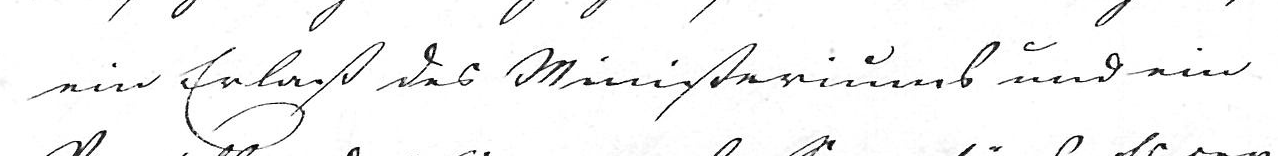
ein Erlaß des Ministeriums und ein
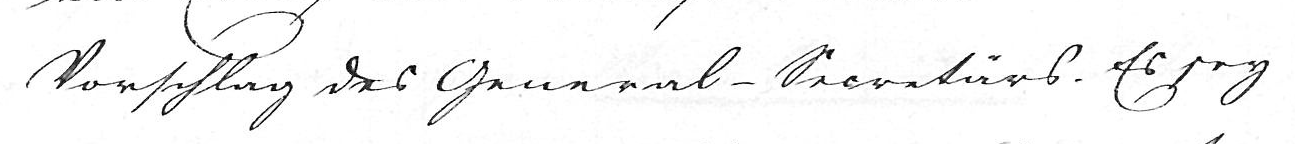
Vorschlag des General-Secretärs. Es sey
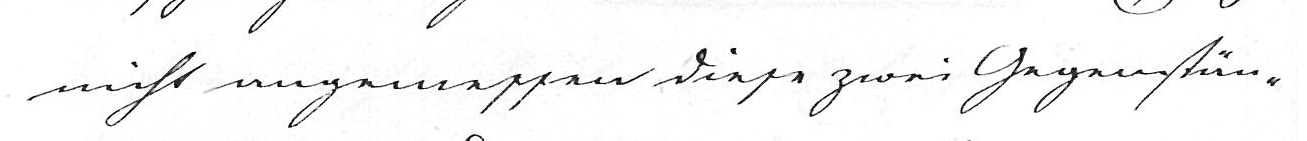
nicht angemessen diese zwei Gegenstän-
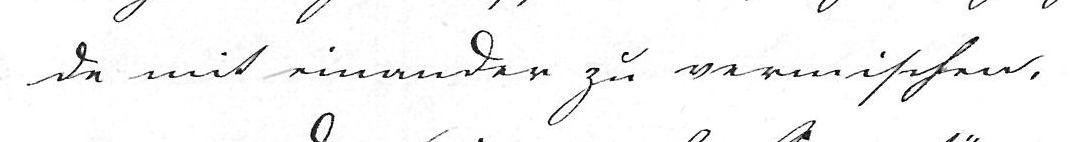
die mit einander zu vermischen.
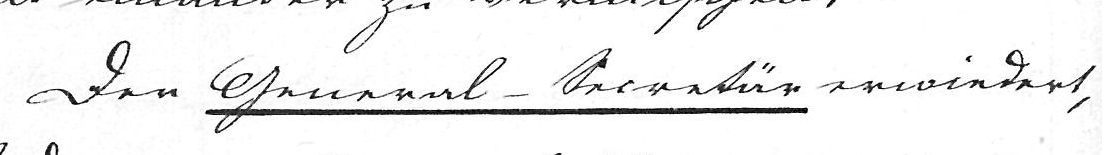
Der General-Secretär erwidert,
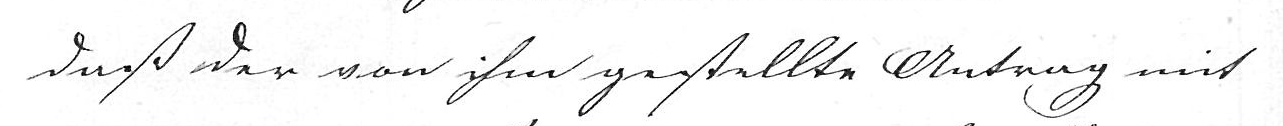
daß der von ihm gestellte Antrag mit
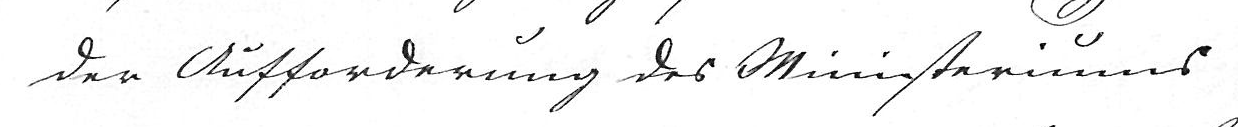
der Aufforderung des Ministeriums
